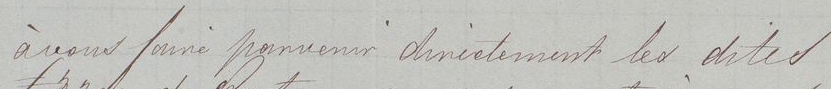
à vous faire parvenir directement les dites
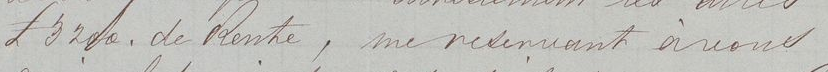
L 3200 de Rente, me reservant à vous
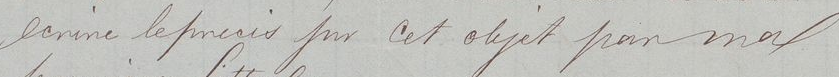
ecrire le precis sur cet objet par ma
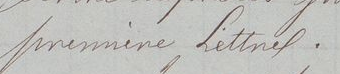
premiere Lettre.
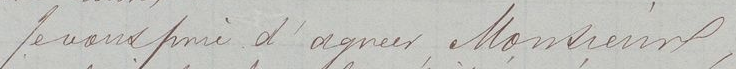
Je vous prie d'agreer, Monsieur,
